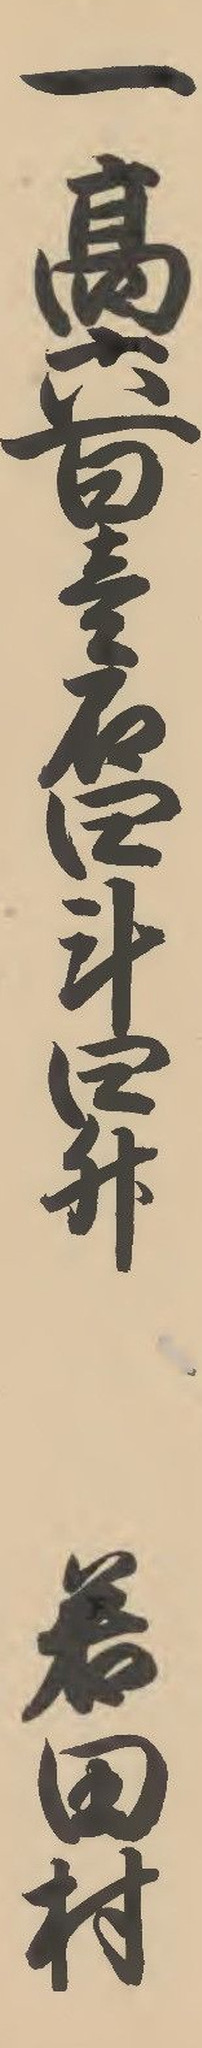一髙六百壱石四斗四升岩田村
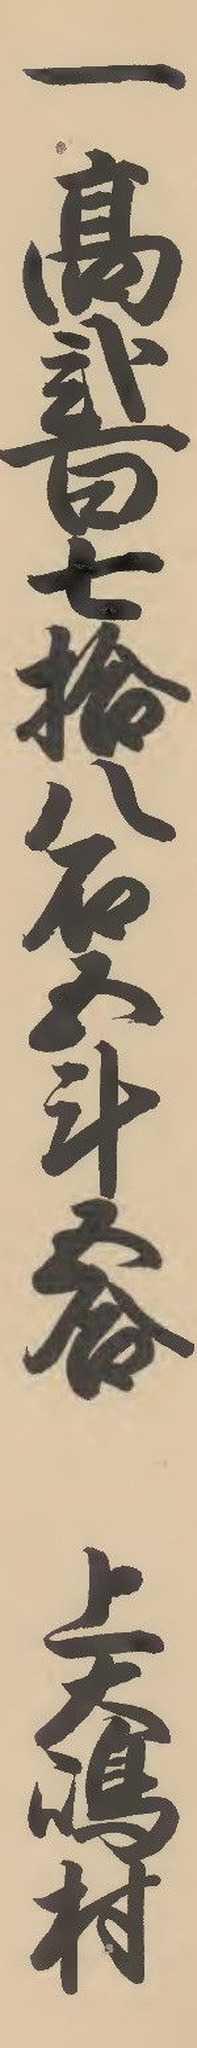一髙弐百七拾八石五斗五合上大嶋村
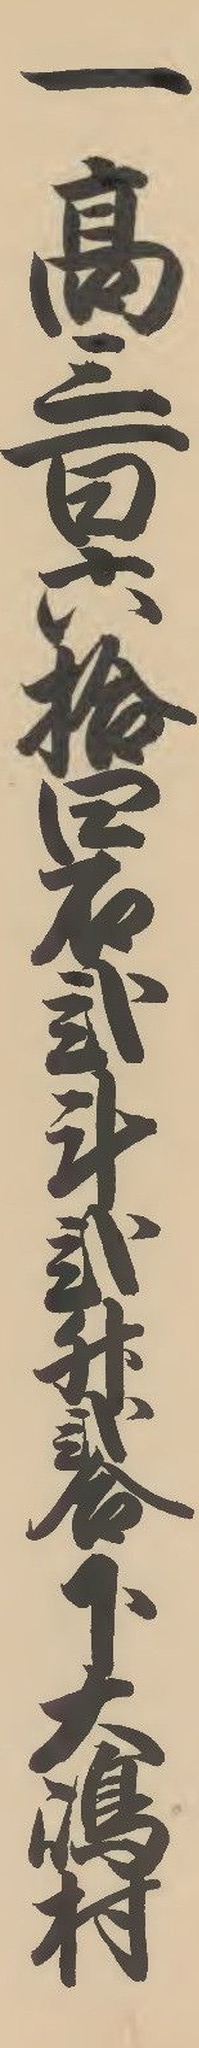一髙三百六拾四石弐斗弐升弐合下大嶋村
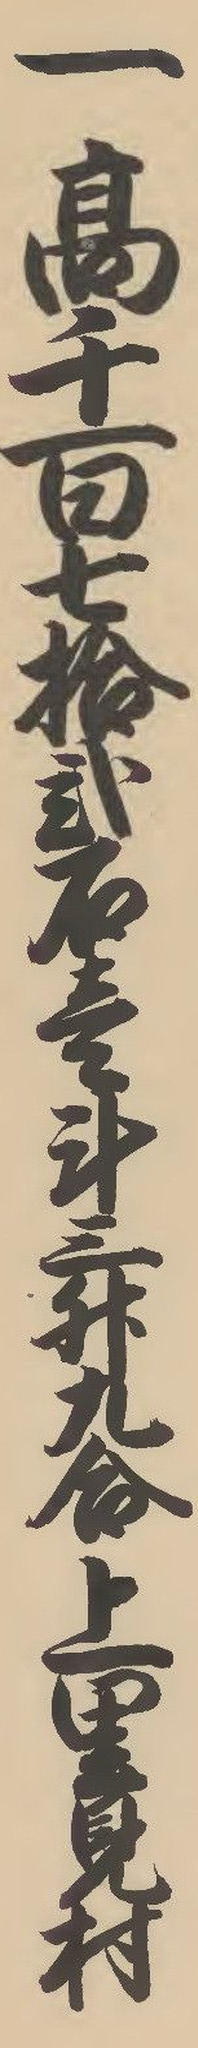一髙千百七拾弐石壱斗三升九合上里見村

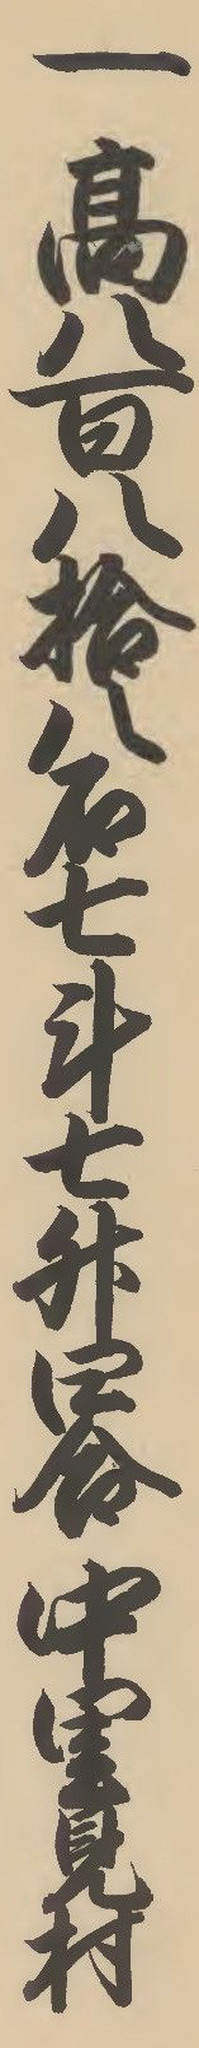一髙八百八拾八石七斗七升四合中里見村
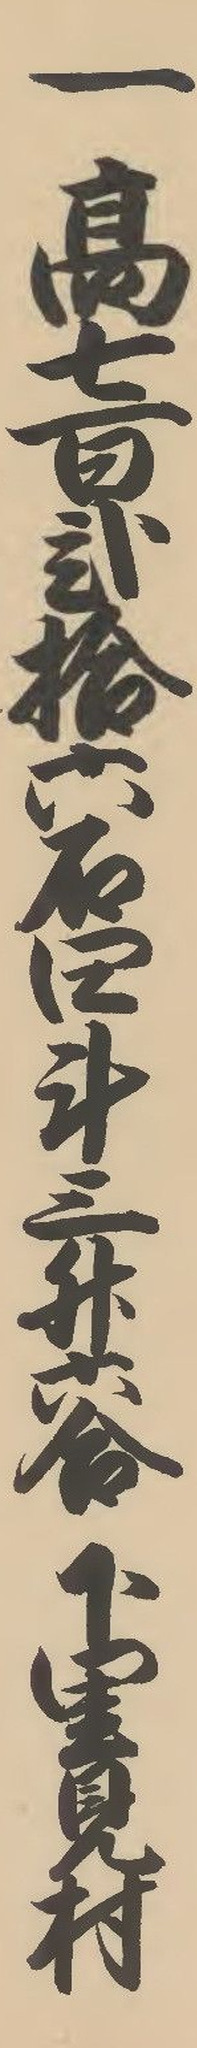一髙七百弐拾六石四斗三升六合下里見村
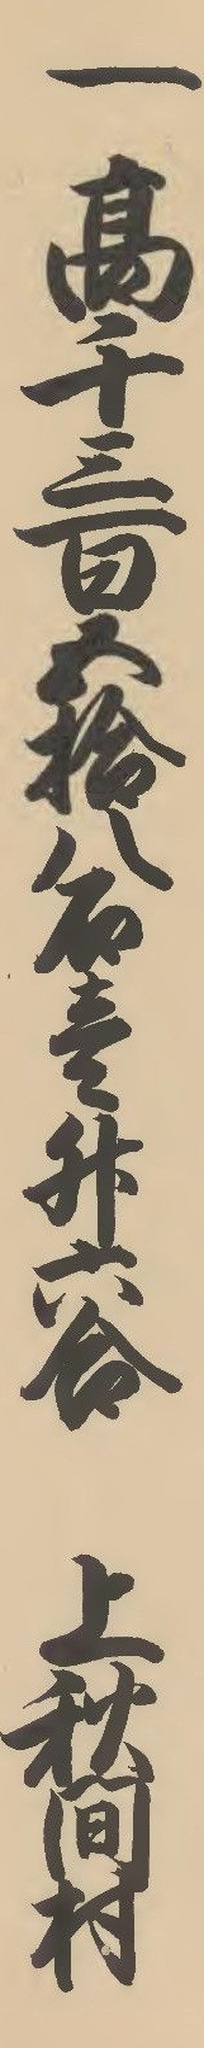一髙千三百五拾八石壱升六合上秋間村
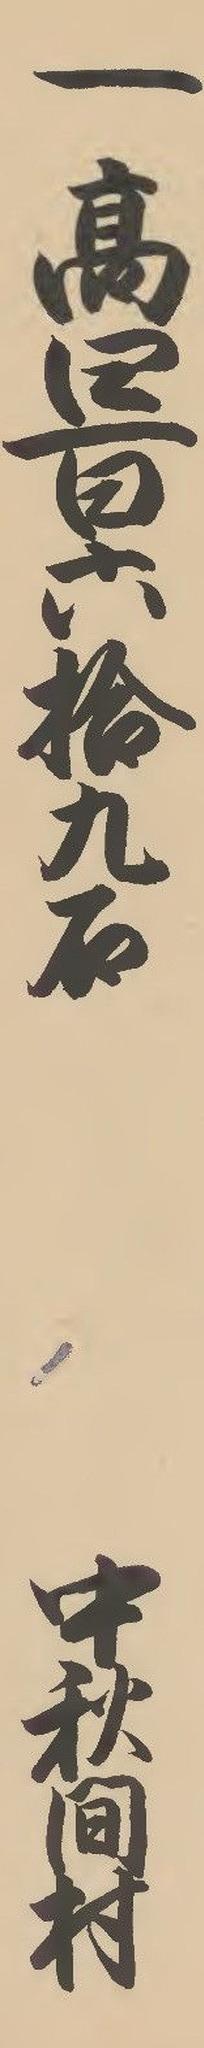一髙四百六拾九石中秋間村
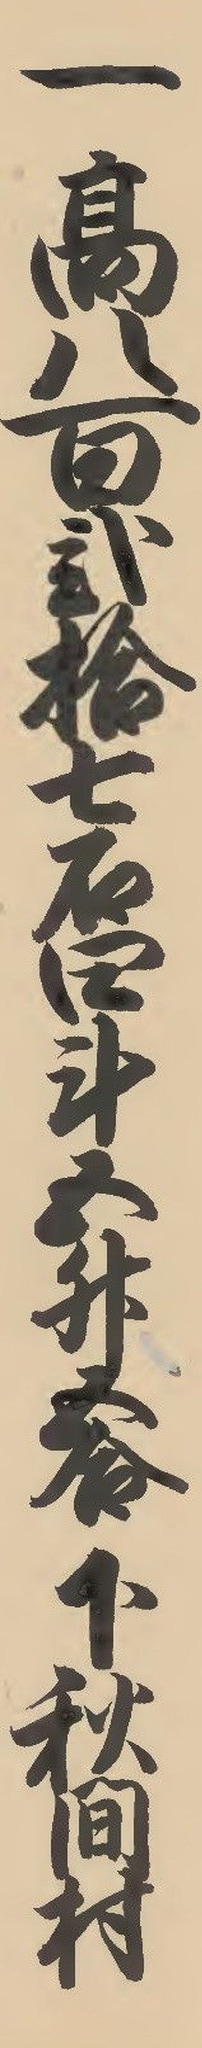一髙八百弐拾七石四斗五升五合下秋間村
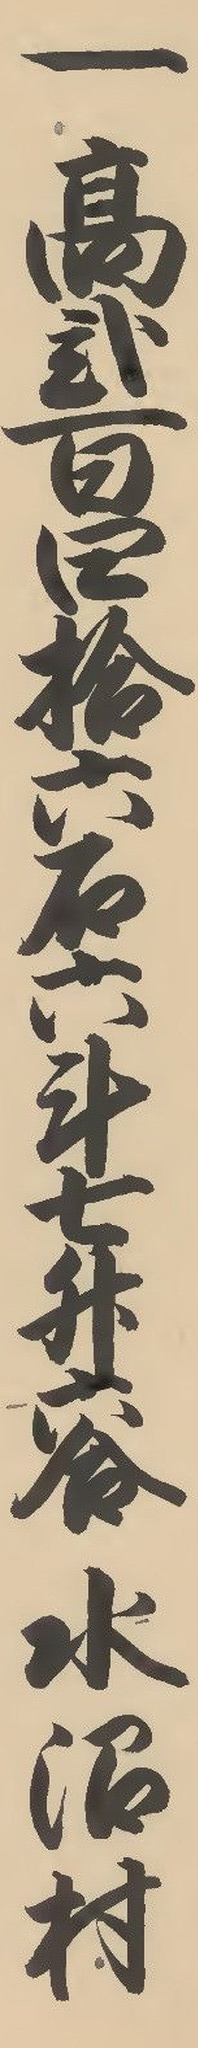一髙弐百四拾六石六斗七升六合水沼村
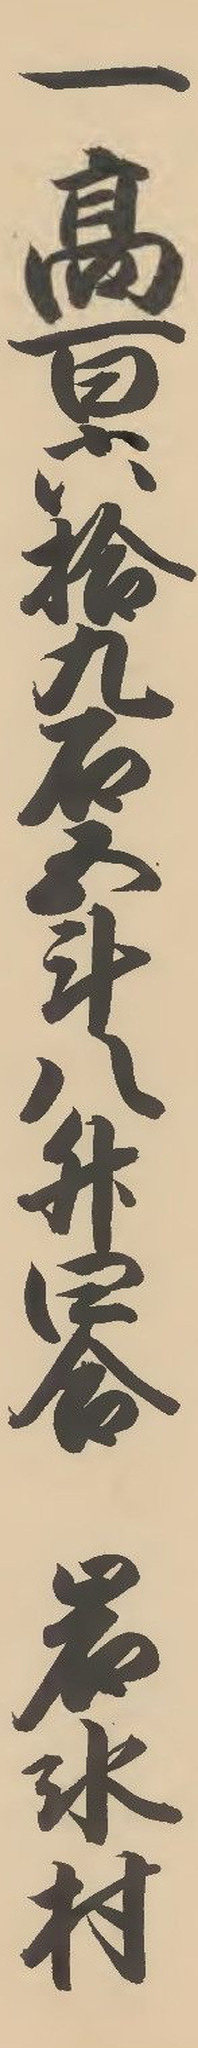一髙百六拾九石五斗八升四合岩水村
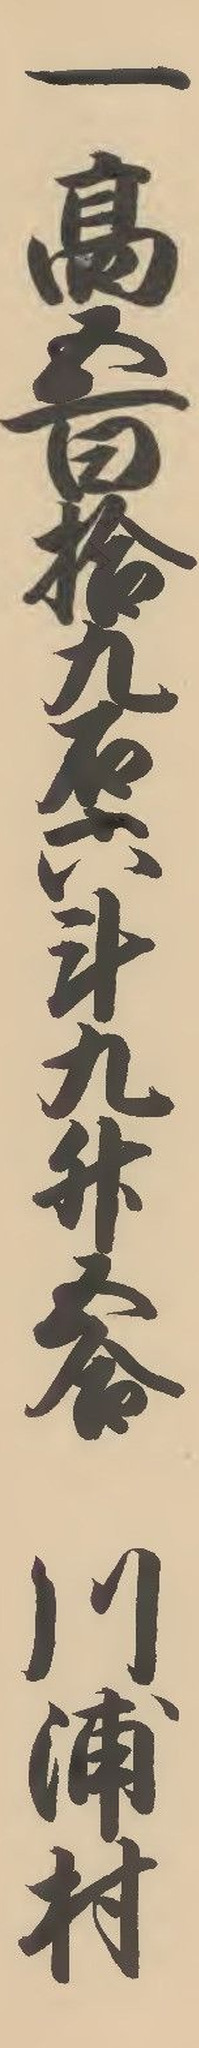一髙五百拾九石六斗九升五合川浦村

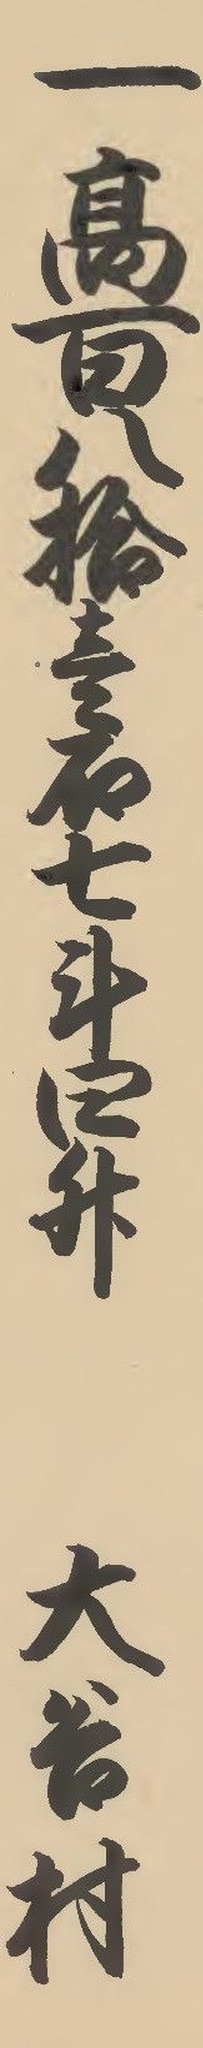一髙百八拾壱石七斗四升大谷村
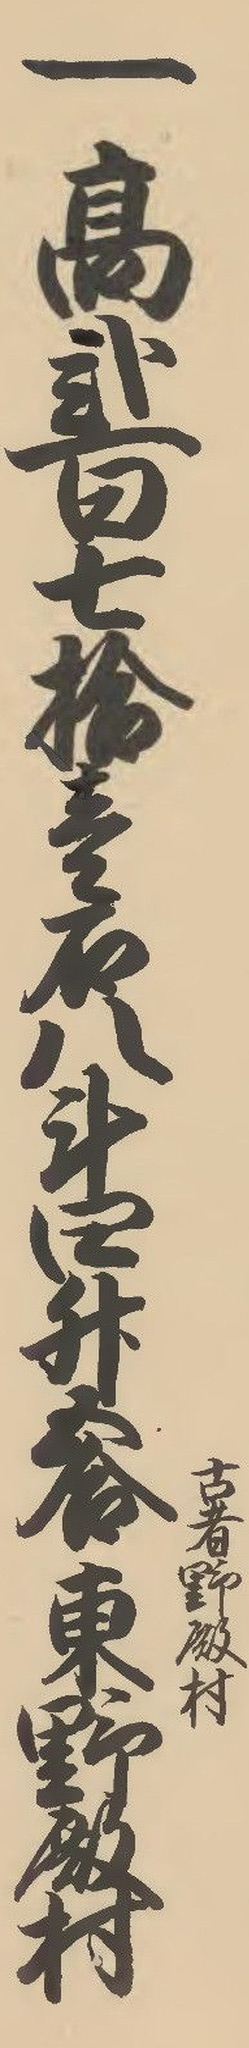一髙弐百七拾壱石八斗四升五合東野殿村
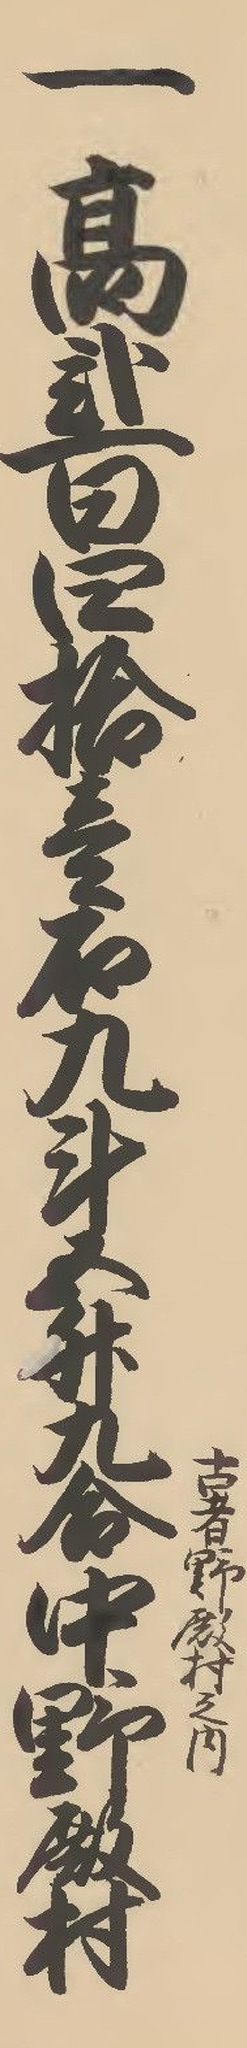一髙弐百四拾壱石九斗五升九合中野殿村
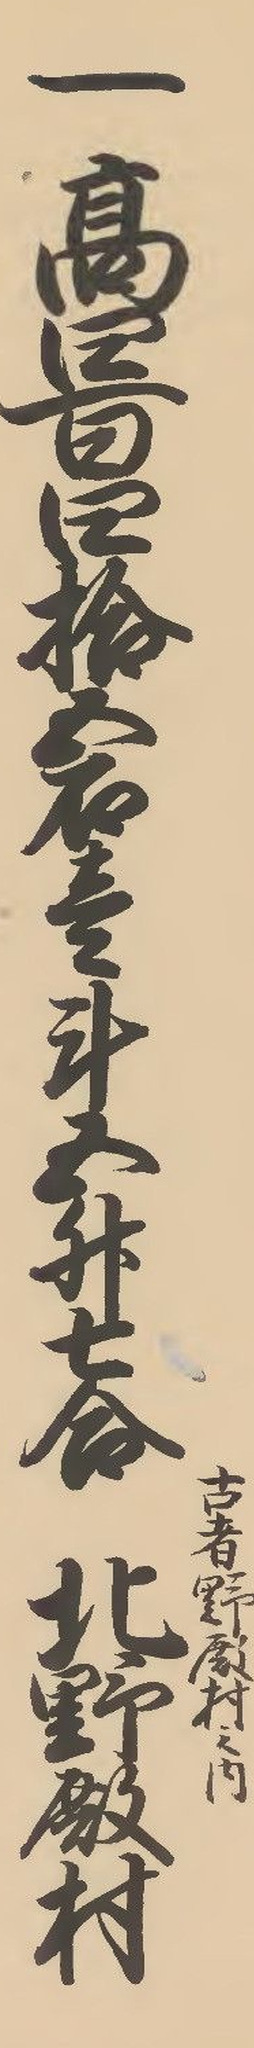一髙四百四拾五石壱斗五升七合北野殿村
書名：上野国郷帳
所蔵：国立公文書館 National Archives of Japan
